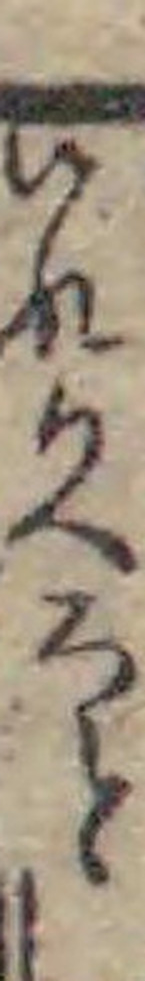いれかへろと
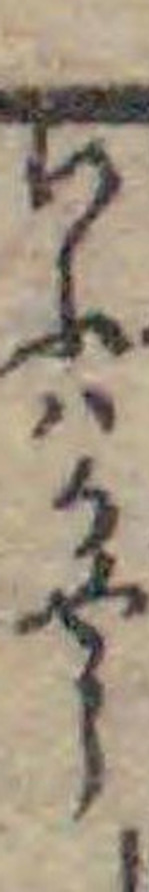いふはかやう
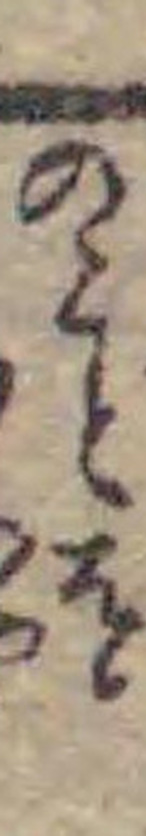のことを
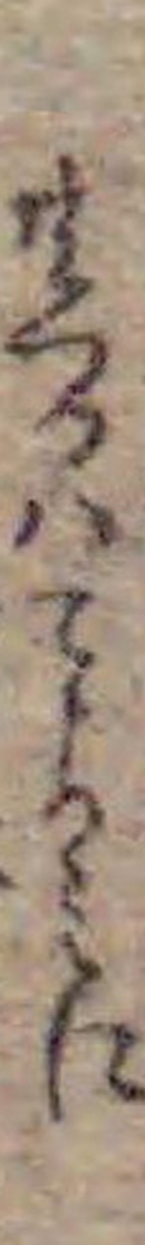まつはてよみに
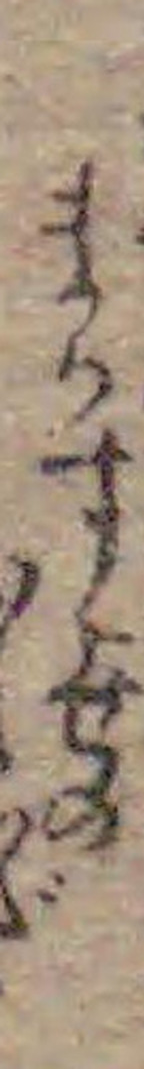まはすくせの

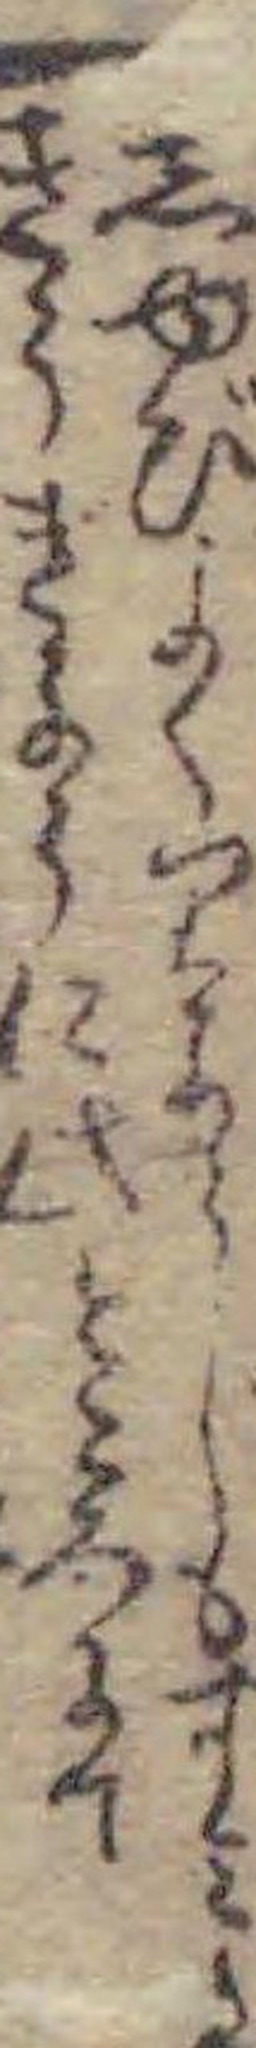きうきように此ところにて
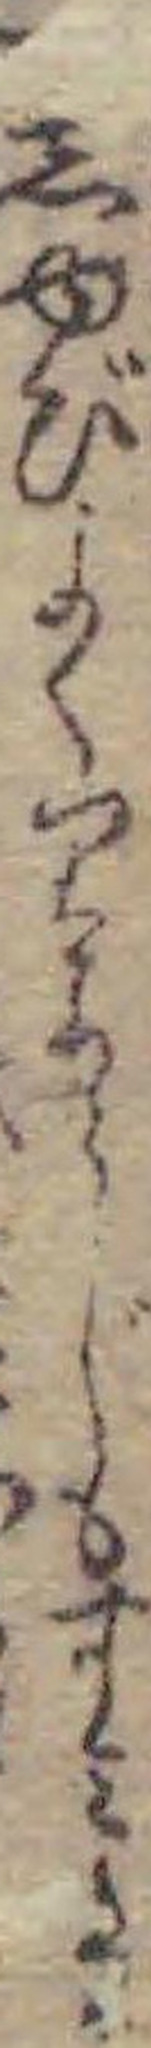しゆびよくりようじもすみたる
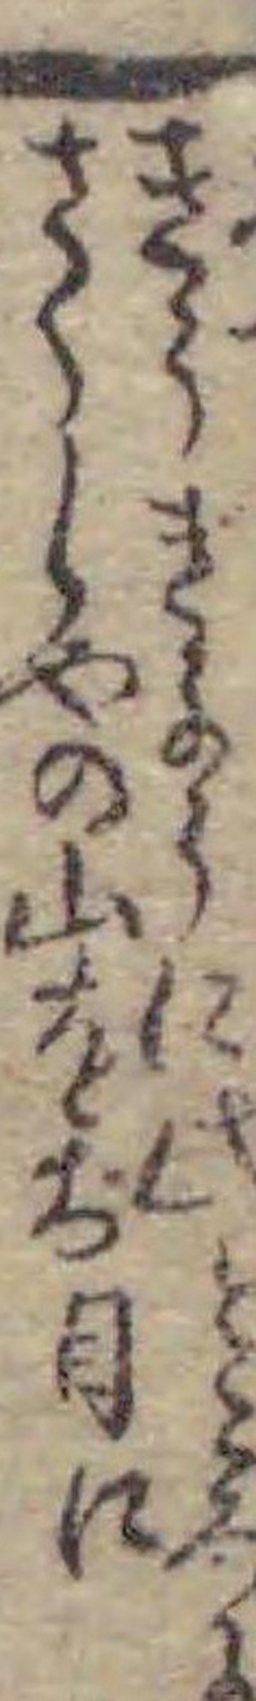さくしやの山をお目に
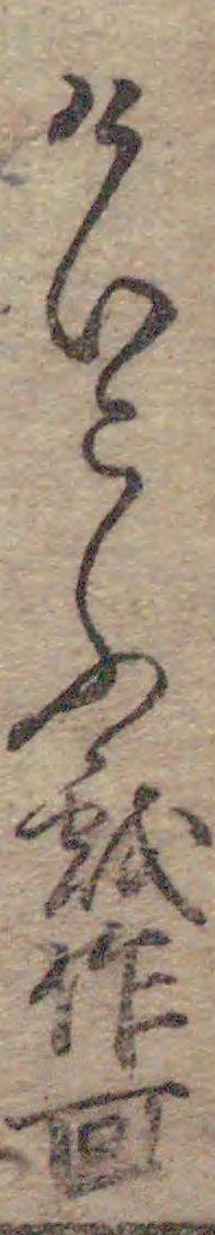けいこふ戯作
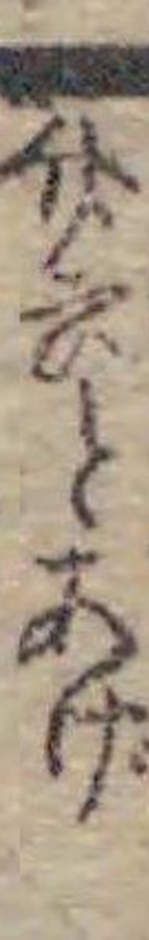介六とあげ
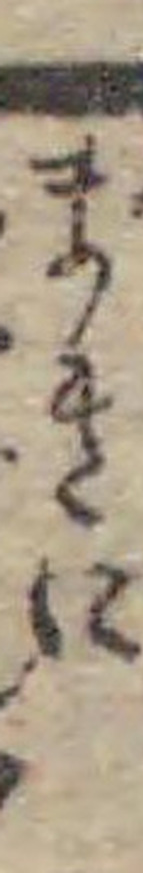まきに
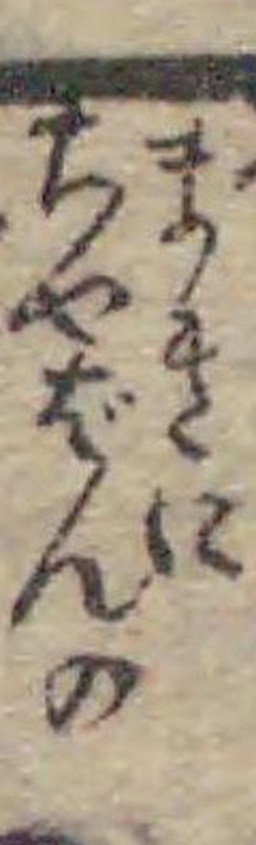ちやばんの
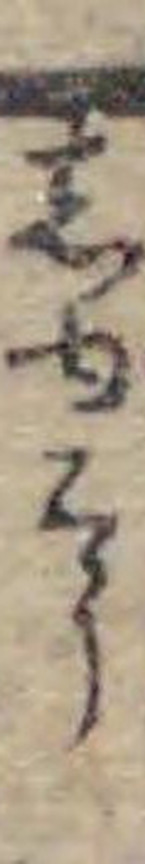しゆこう
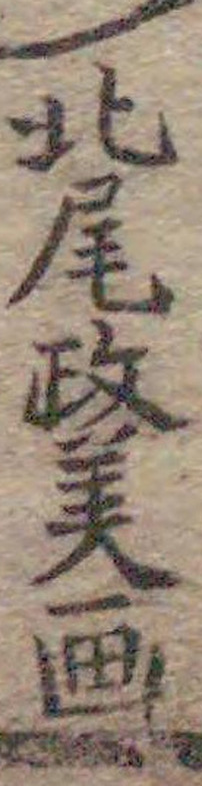北尾政美画
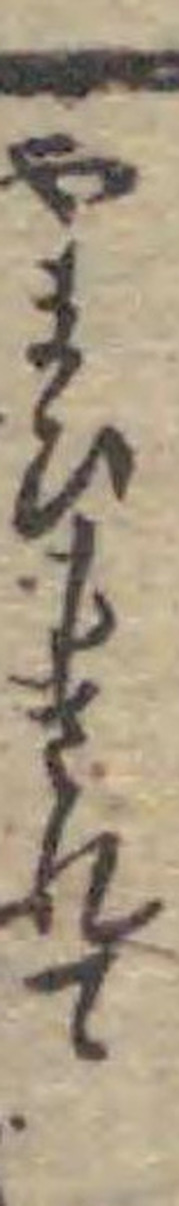やまひもきれて
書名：江戸花俳優贔屓 : 3巻
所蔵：国立国会図書館 National Diet Library, JAPAN
